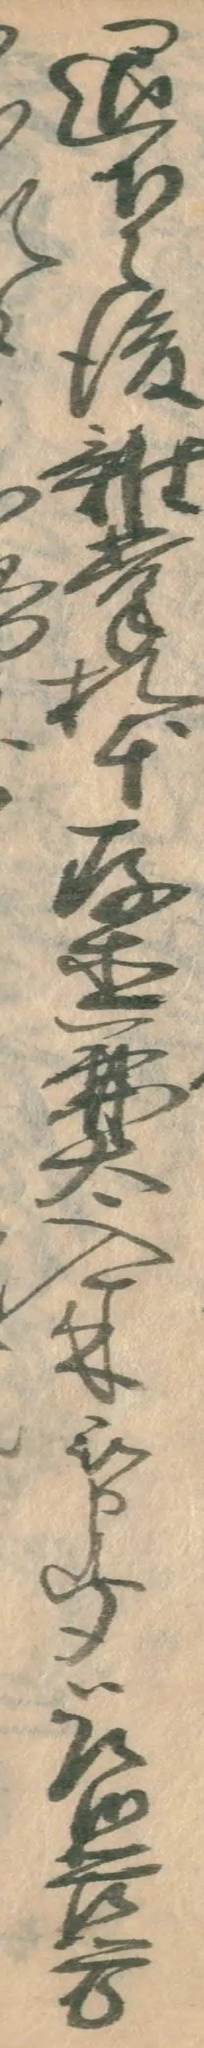退下之後雑掌札本存直兼太入来被申聞ハ乍御苦労
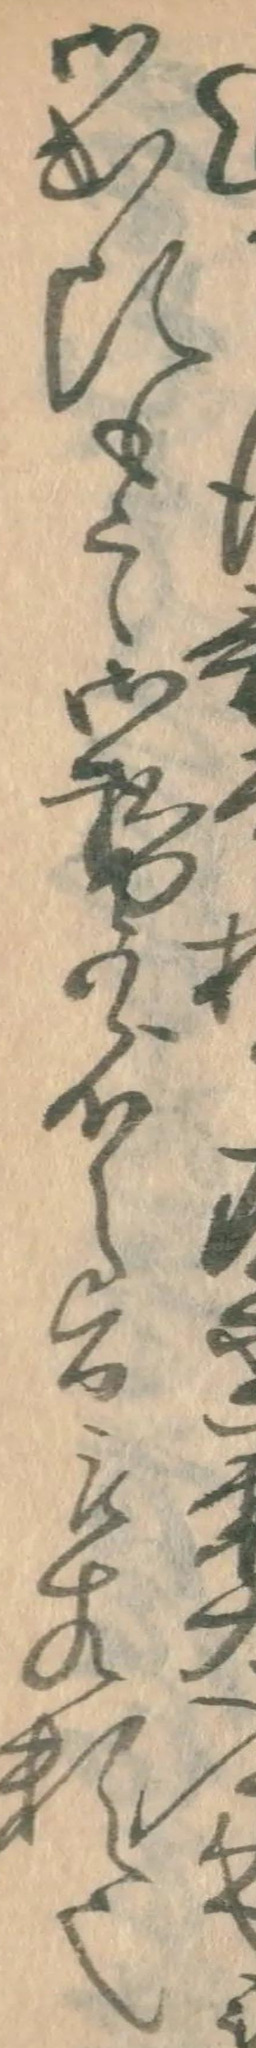御出頭も候て御務可被下候旨被相頼也

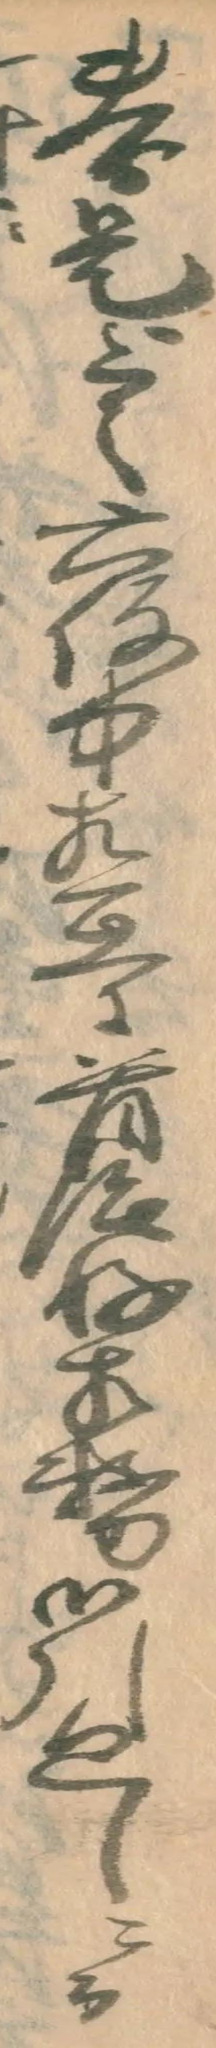夫ゟ是迄之六役中相互に首尾好相務御引廻しニ而
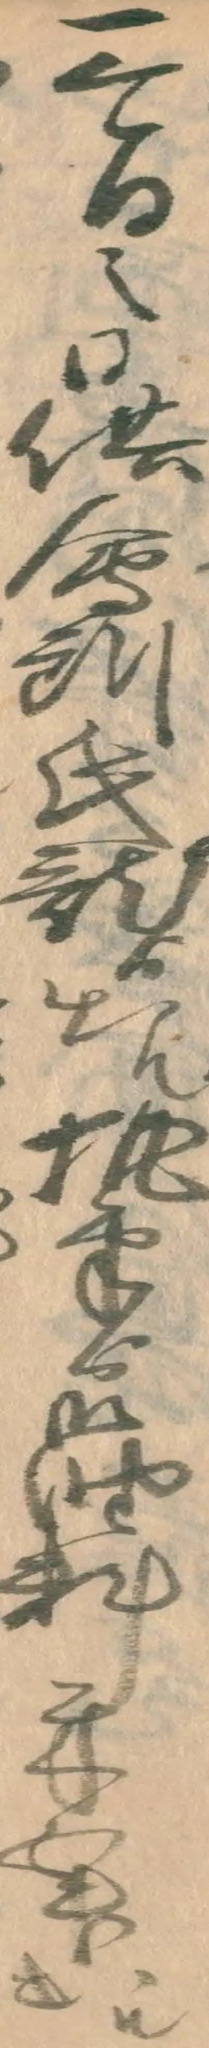一今日之日供会所氏龍ゟ出ル執筆ゟ御坐料米五升出ル
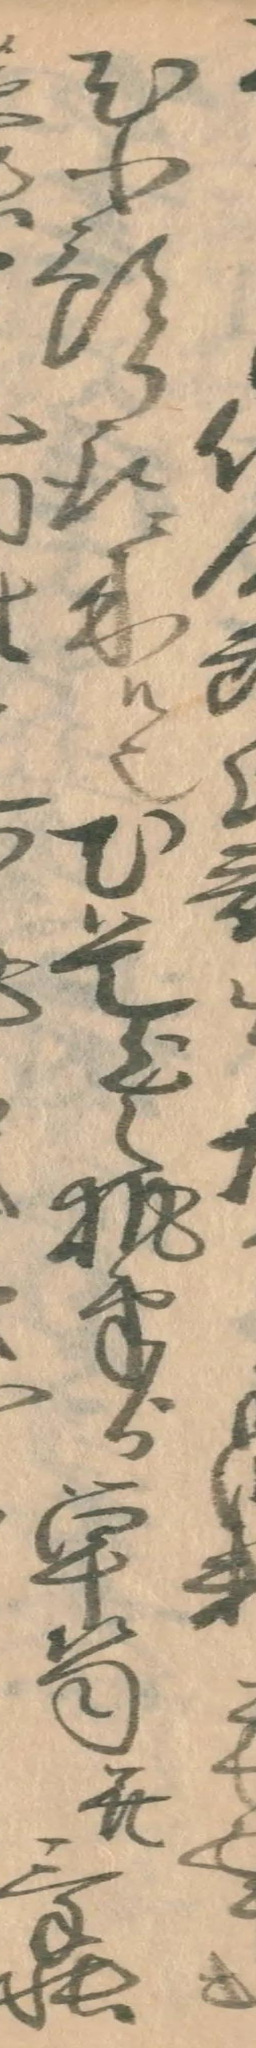尤小預り取ニ来ル也尤是迄之執筆ゟ箪笥并気帳
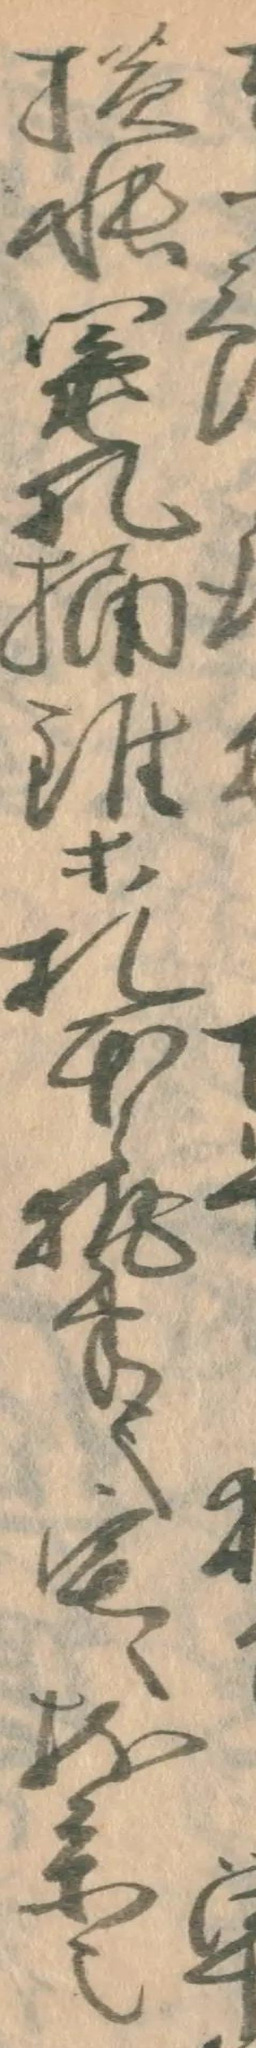横帳鬮札桶錐等札本執筆之宅へ持参也
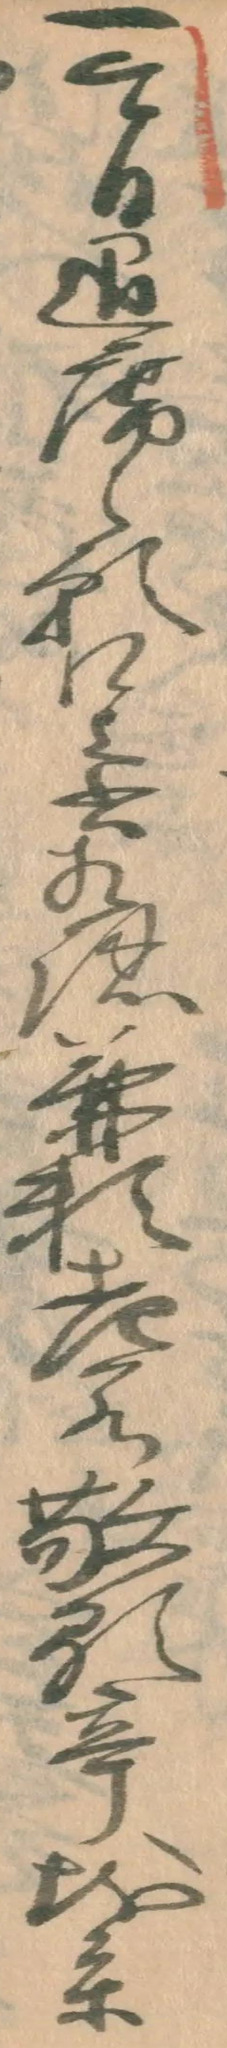一今日退席之願口上書相認兼頼老若敬顕亭へ持参
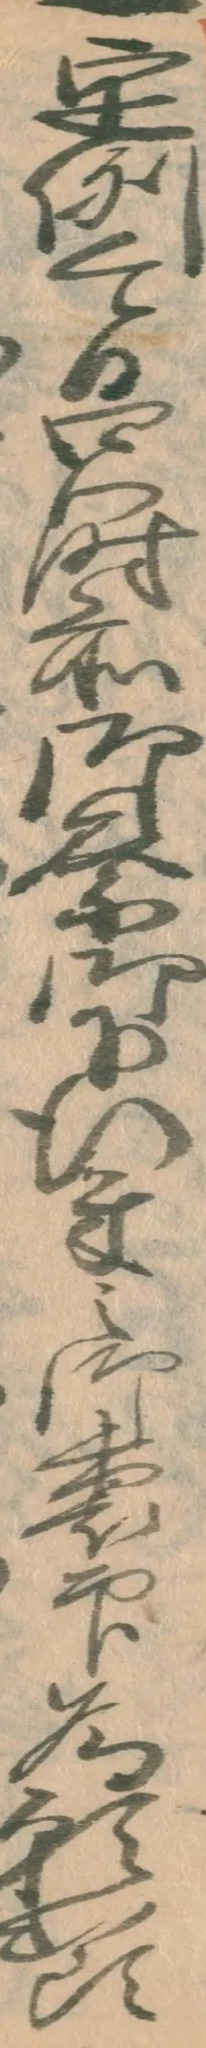一定例今日四ツ時前御祭御下行米之御裏印為願出頭
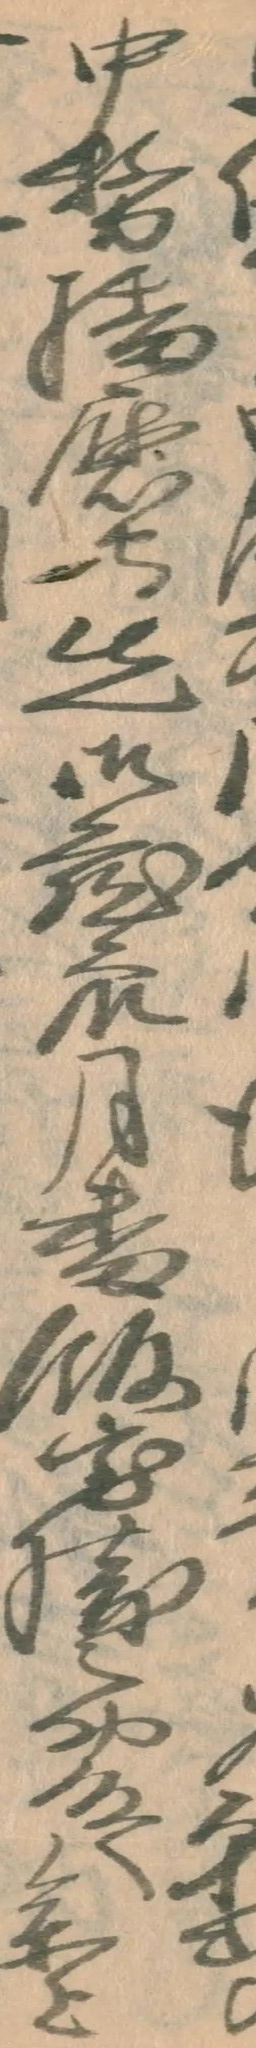中務播磨守先御蔵衆月番飯室勝之助殿へ参上
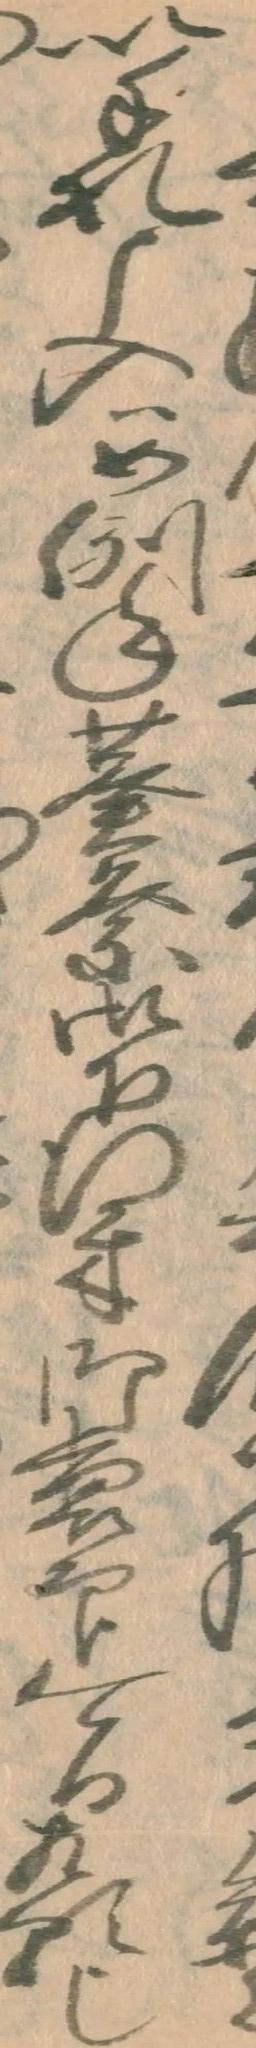以手札申入ハ如例年葵祭御下行米御裏印今日相願申候
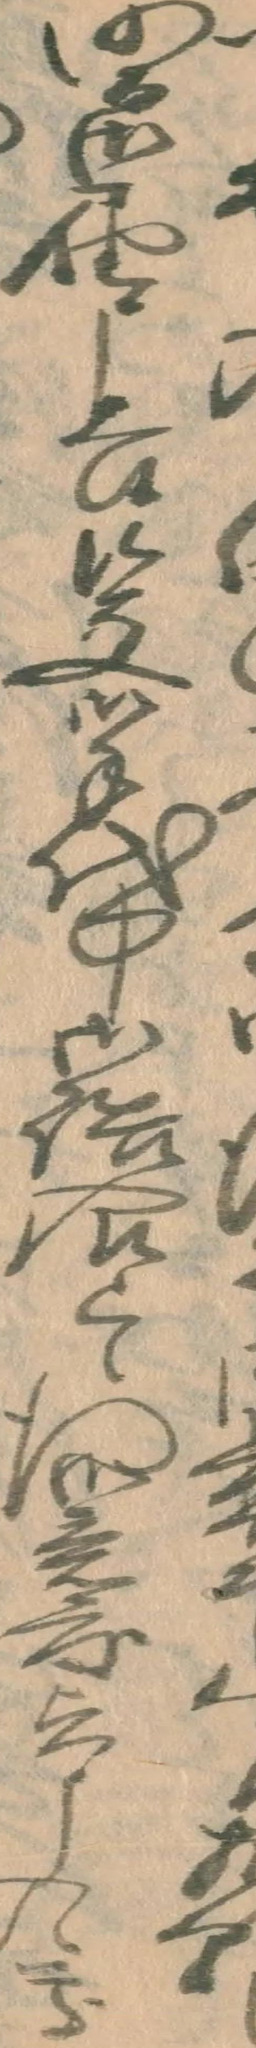仍而御届申上候且又御手代中御詰合候て得御意度旨申入候処
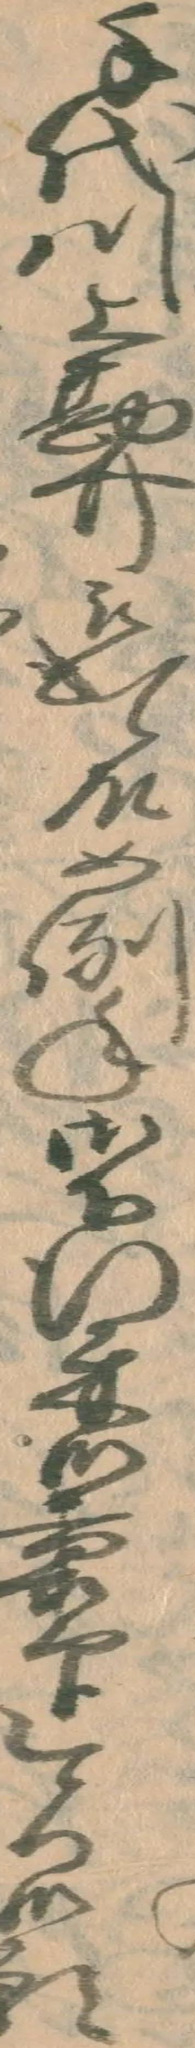手代川上勘介被出候故如例年御下行米御裏印今日御願
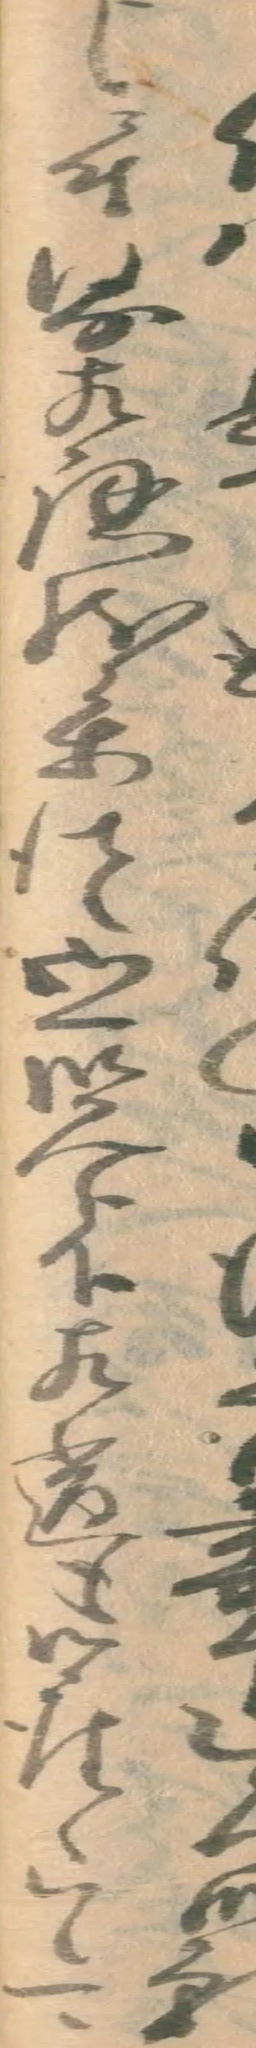申候ニ付則相認持参仕候御一覧被下相違も御座候ハヽ可
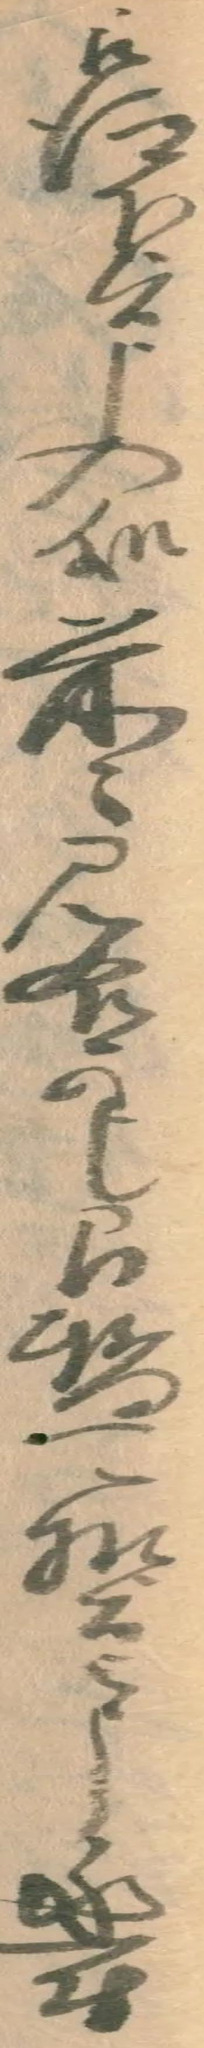被仰下旨申入候処前々見合可申候間暫可扣旨被申候逐付
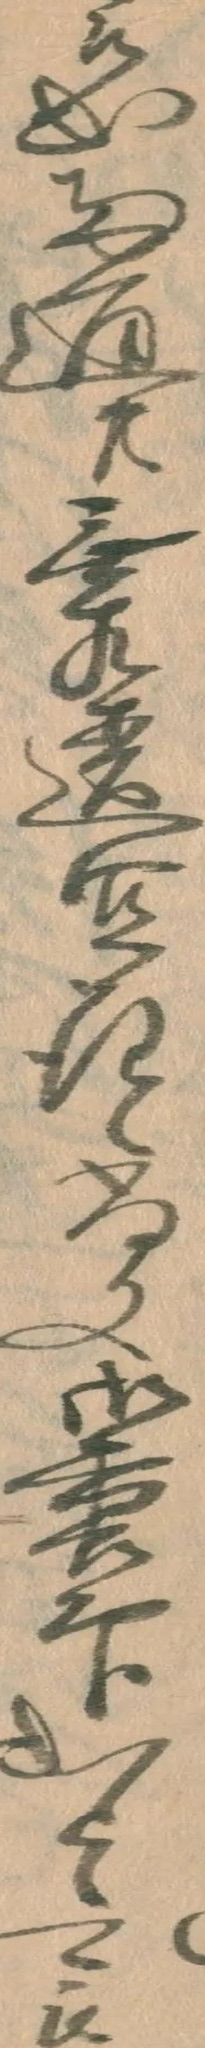被出両通共無相違宜御座候尚又御裏印出候て可被
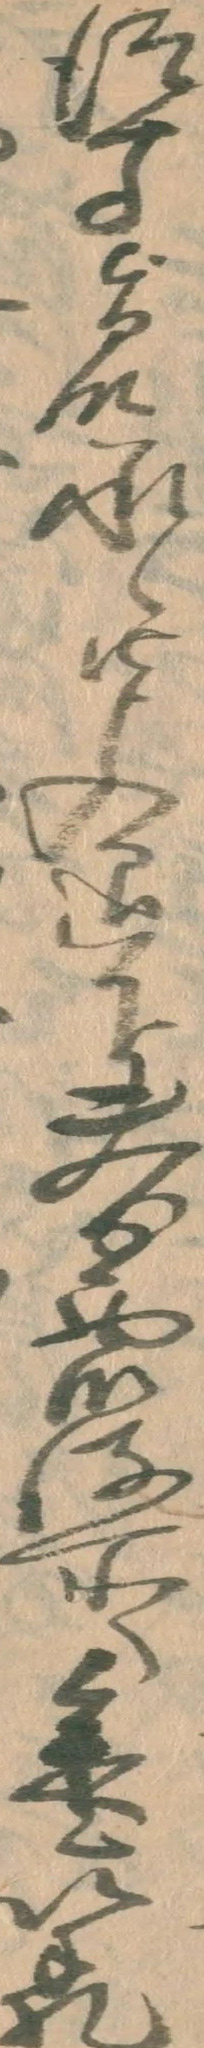仰旨故承候由申入退下夫ゟ西御役所へ参候以手札
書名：賀茂社記録. 第60冊
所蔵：国立国会図書館 National Diet Library, JAPAN
